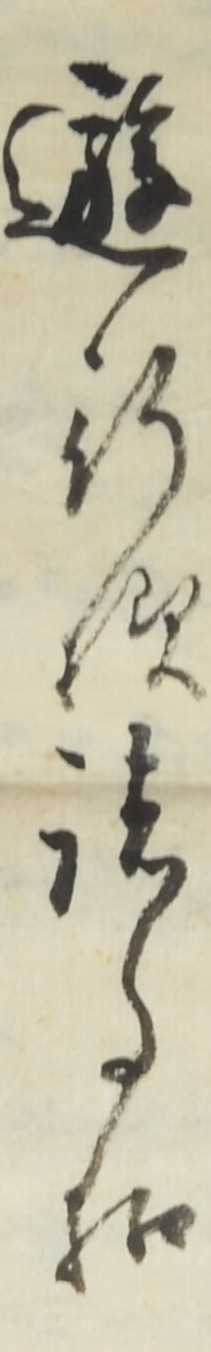遊行様諸事控

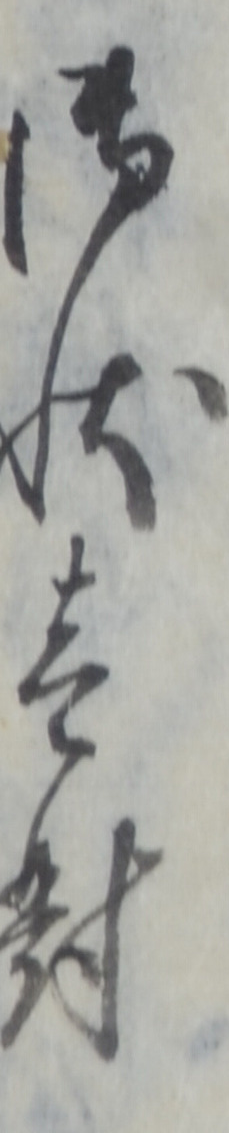御状壱封
